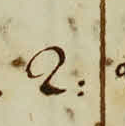2:
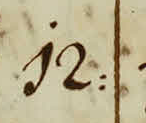12:
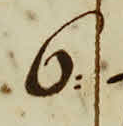6:
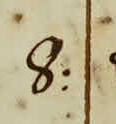8:
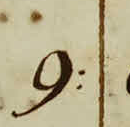9:
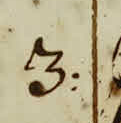3:
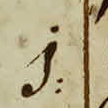1:
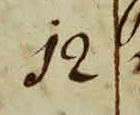12
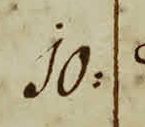10:
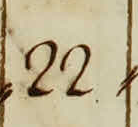22
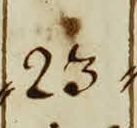23
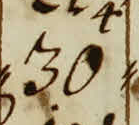30
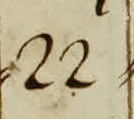22
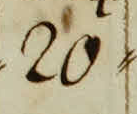20
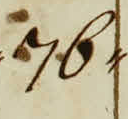76
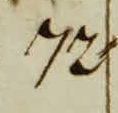72
